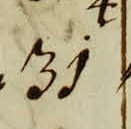31
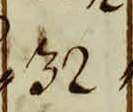32
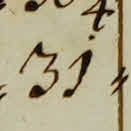31
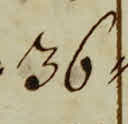36
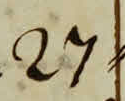27
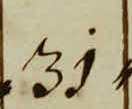31
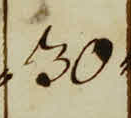30
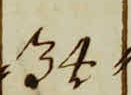34
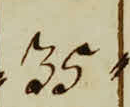35
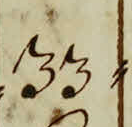33
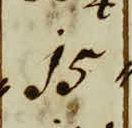15
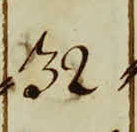32
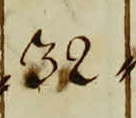32
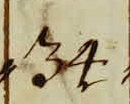34
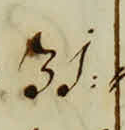31:
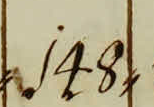148
